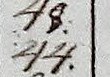44.
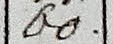60
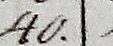40.
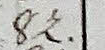82.
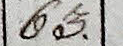63.
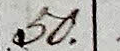50.
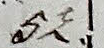52.
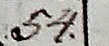54.
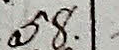58.
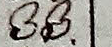33.
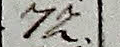72.
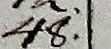48.
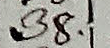38.
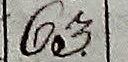63.
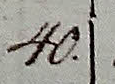40.
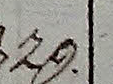29.
